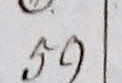59
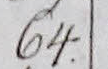64.
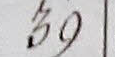39
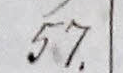57.
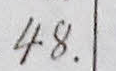48.
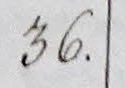36.
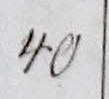40
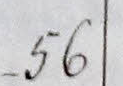56
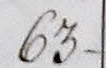63
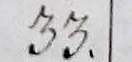33.
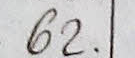62.
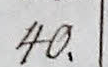40.
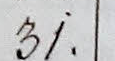31.
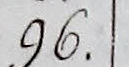96.
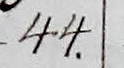44.
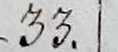33.
